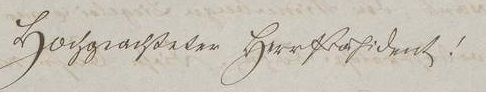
Hochgeachteter Herr Präsident!
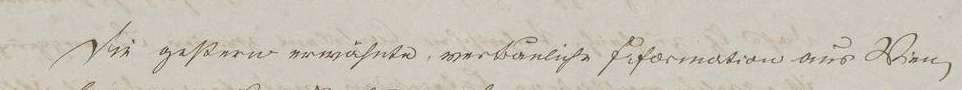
Die gestern erwähnte, vertrauliche Information aus Wien,
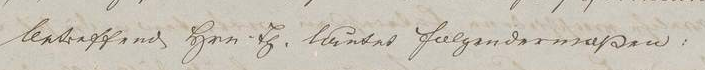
betreffend Hrn. Th. lautet folgendermaßen:
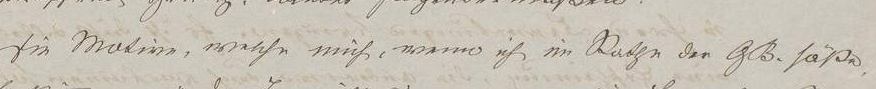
«Die Motive, wleche mich, wenn ich im Rathe der GB. säße,
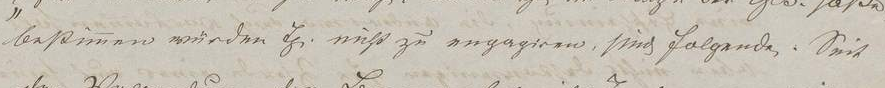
bestimmen würden Th. nicht zu engagiren, sind folgende. Seit
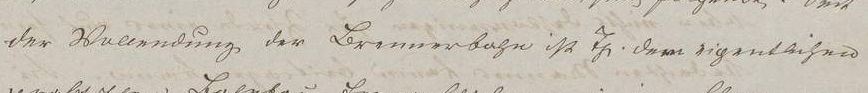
der Vollendung der Brennerbahn ist Th. dem eigentlichen
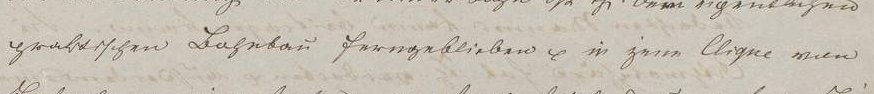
praktischen Bahnbau ferngeblieben & in jene Clique von
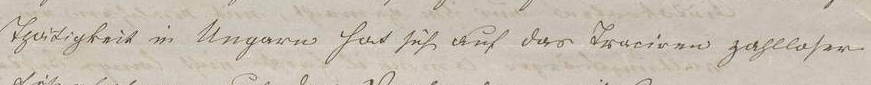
Thätigkeit in Ungarn hat sich auf das Traciren zahlloser
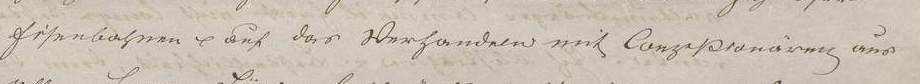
Eisenbahnen & auf das Verhandeln mit Conzeßionären aus
